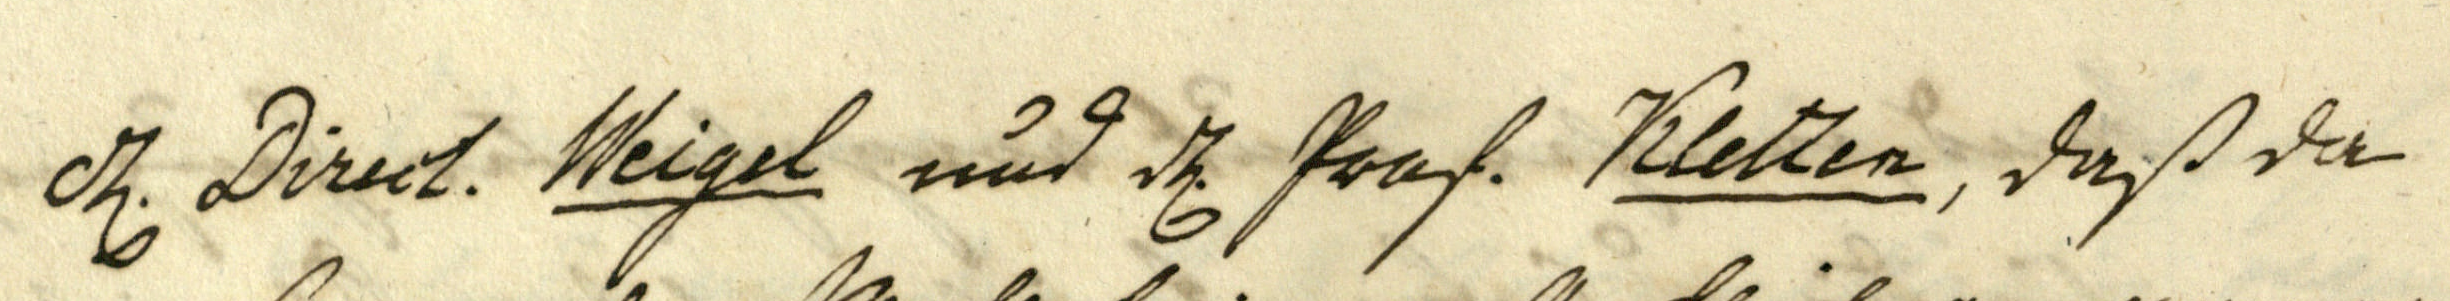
dh. Direct. Weigel und dh. Prof. Kletten, daß da
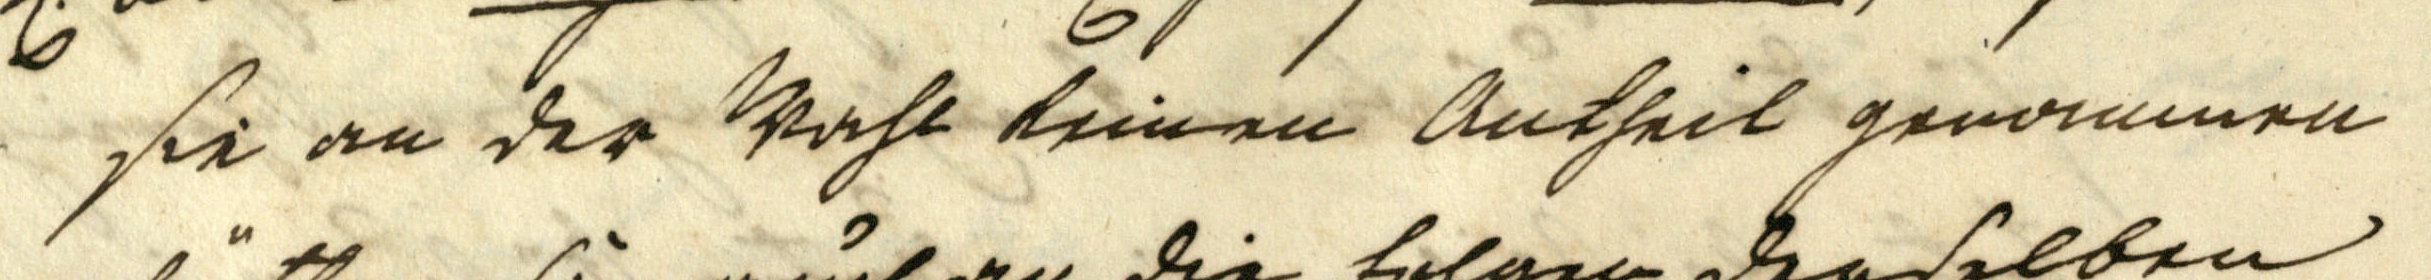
sie an der Wahl keinen Antheil genommen
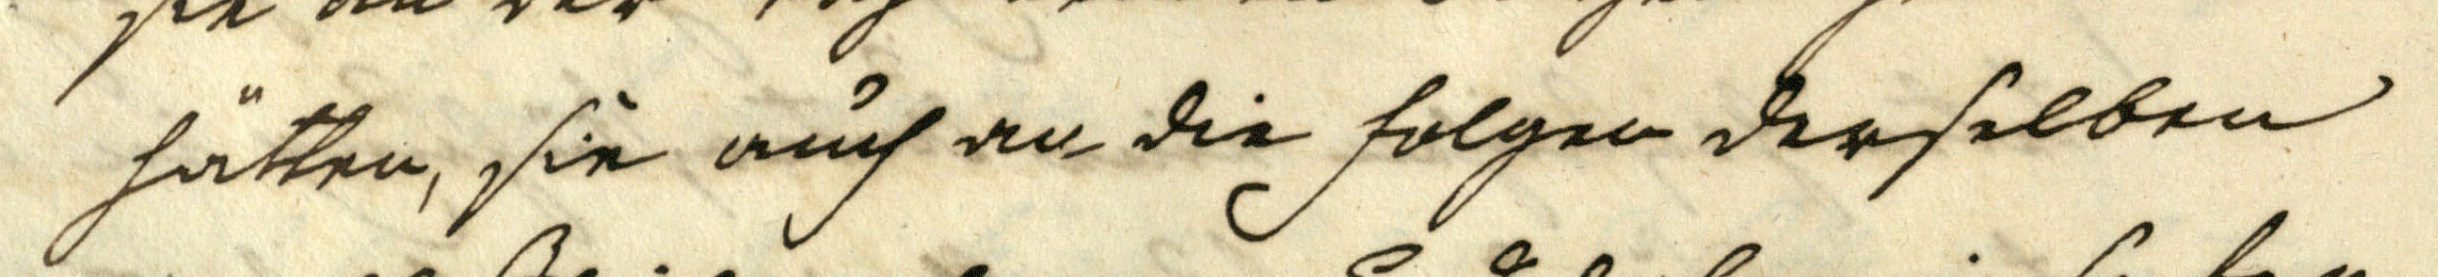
hätten, sie auch an die Folgen derselben
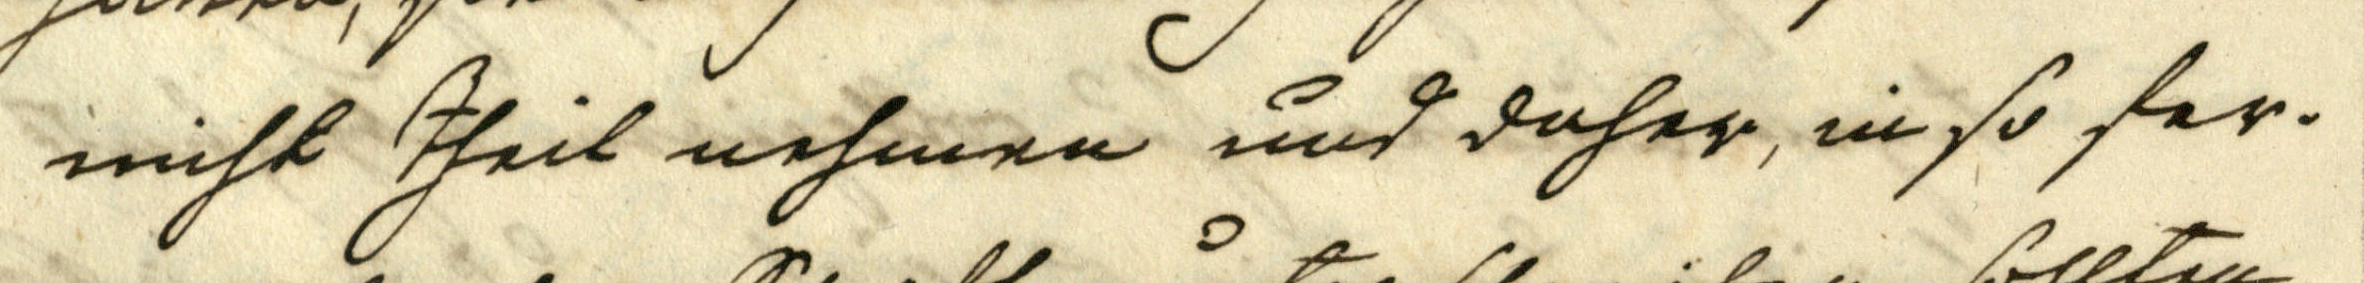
nicht Theil nehmen und daher, in so fer¬
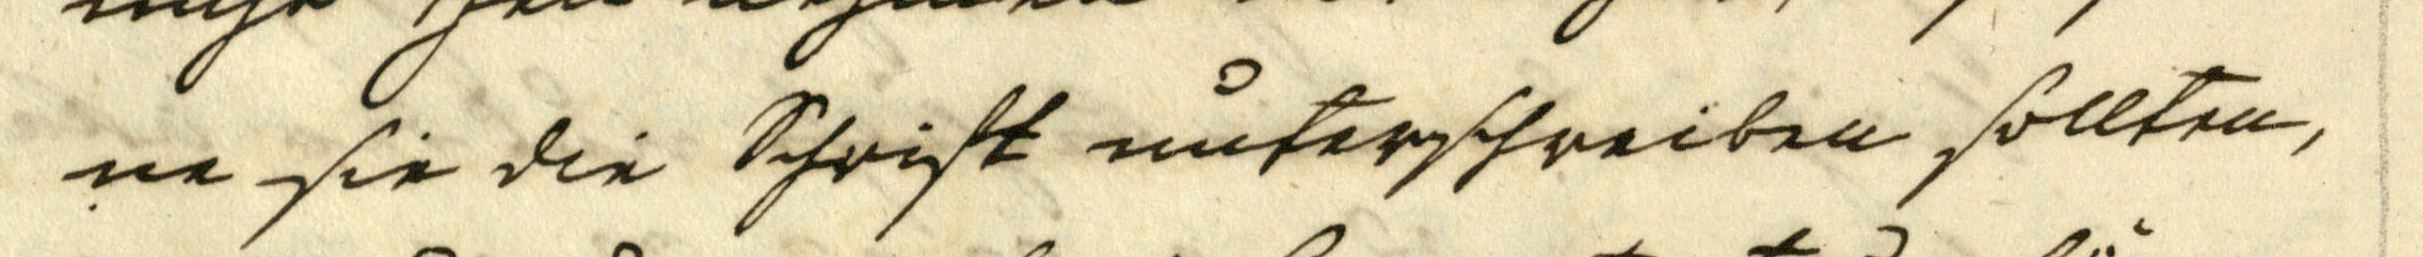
ne sie die Schrift unterschreiben sollten,
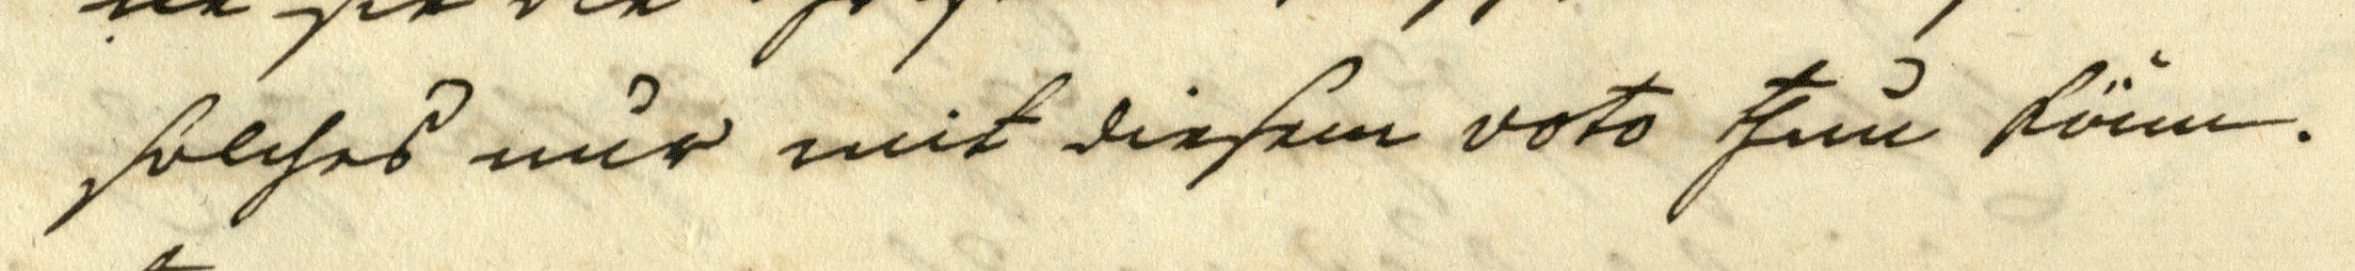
solches nur mit diesem voto thun könne-
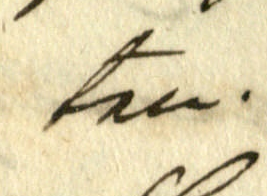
ten.
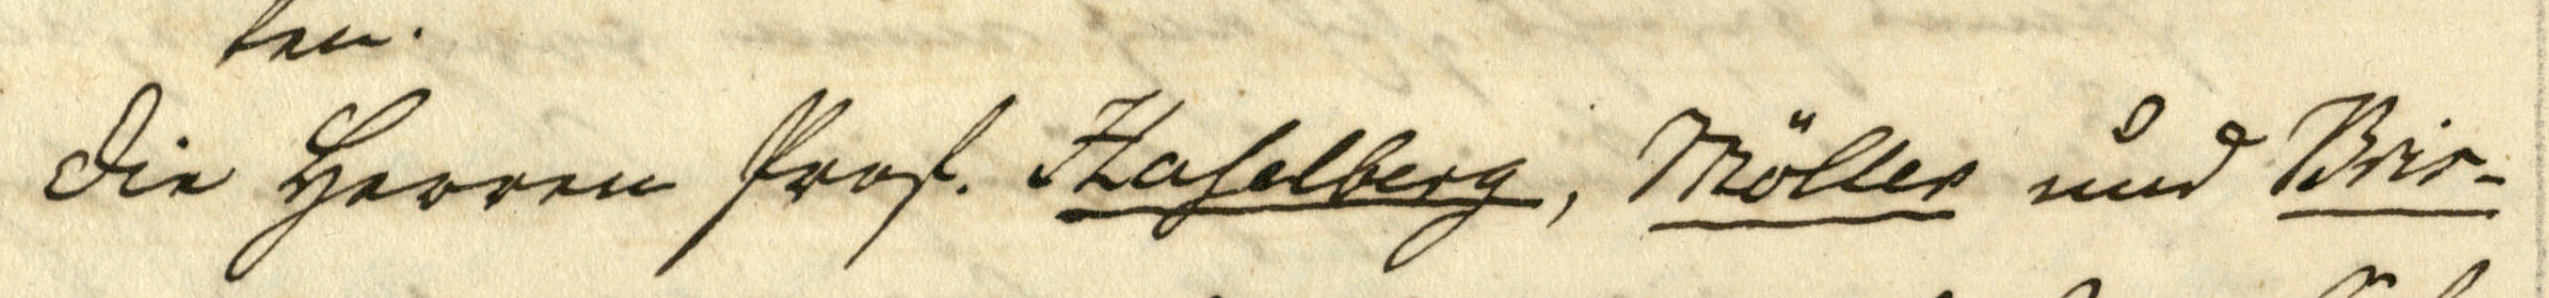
Die Herren Prof. Haselberg, Möller und Bris¬
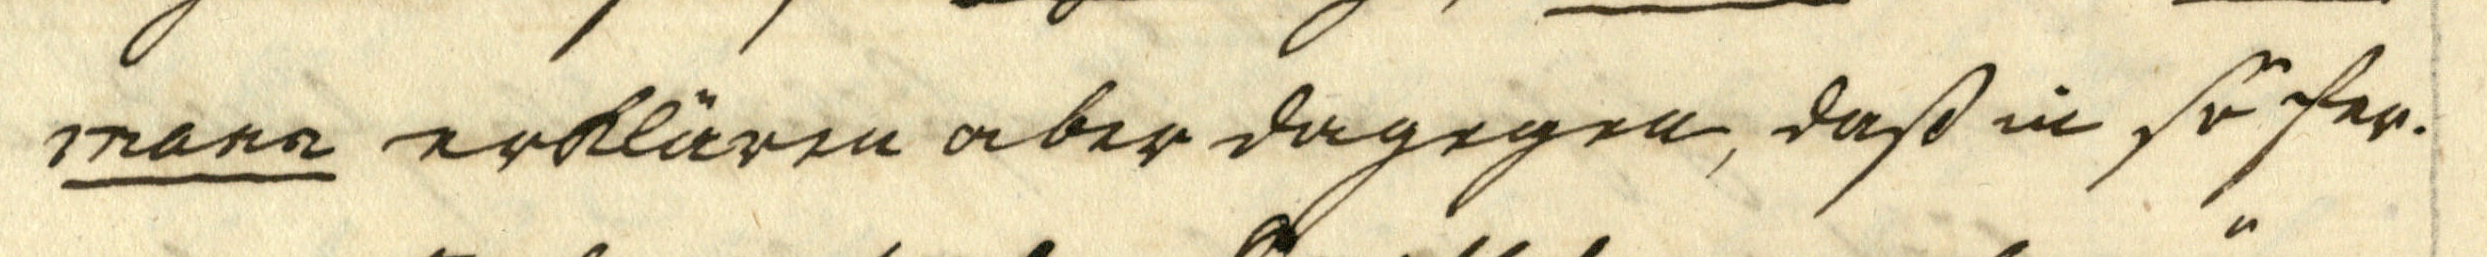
mann erklären aber dagegen, daß in so fer¬
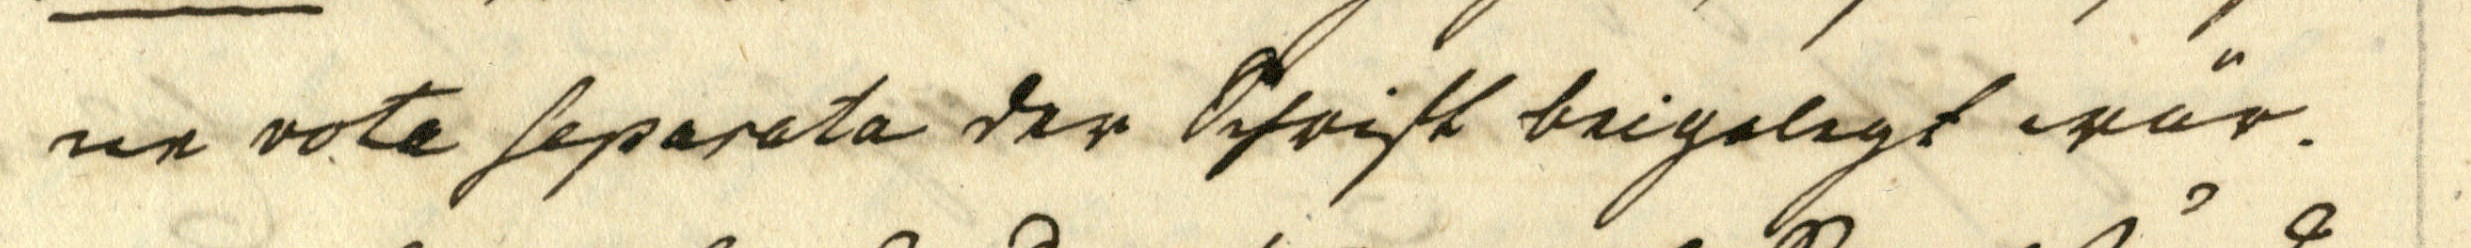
nen vota separata der Schrift beigelegt wer¬
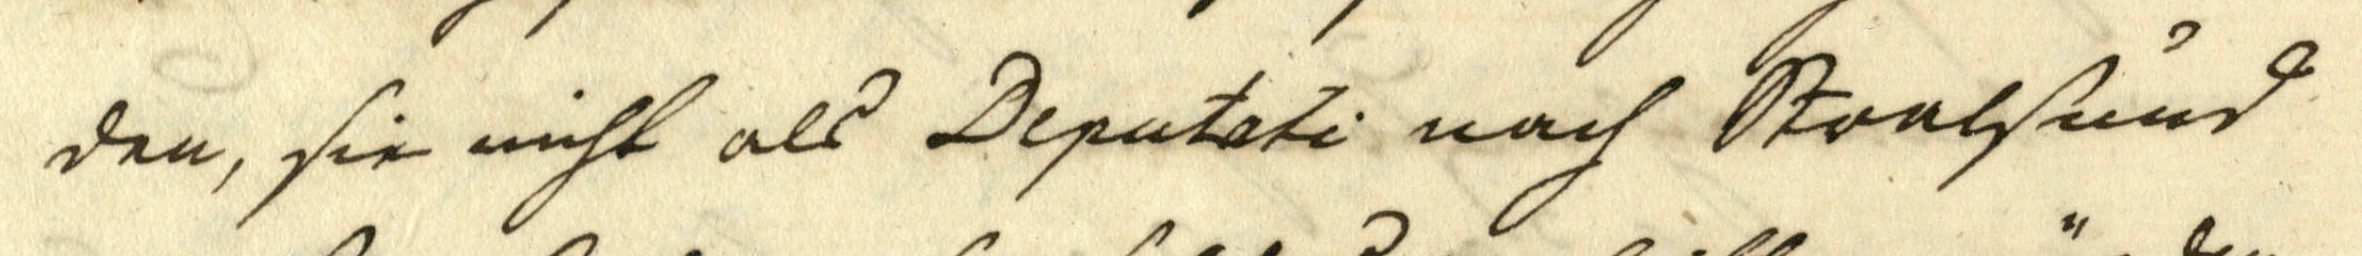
den, sie nicht als Deputati nach Stralsund
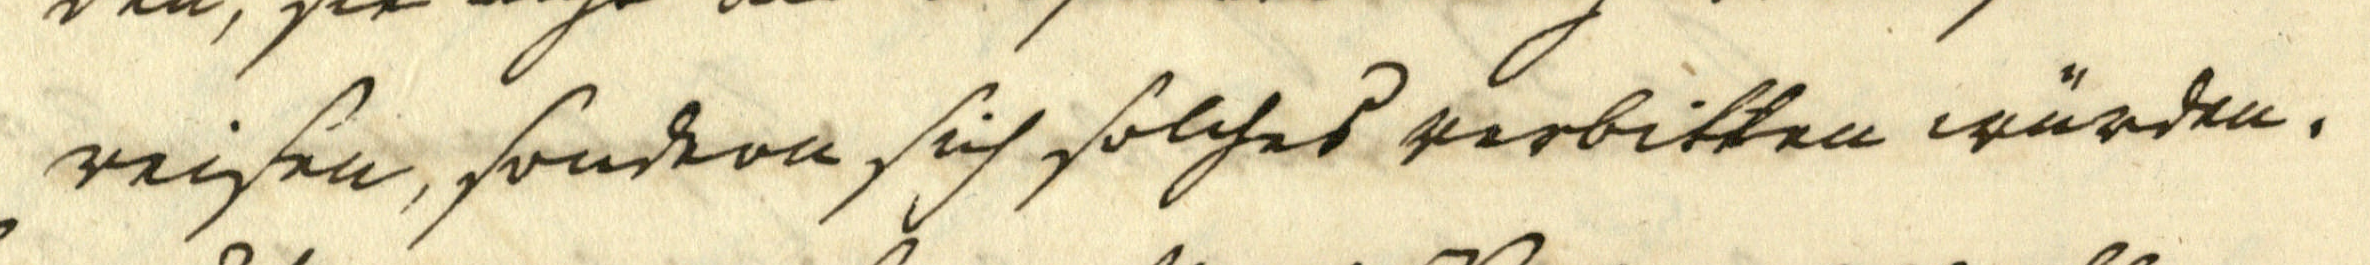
reisen, sondern sich solches verbitten würden.
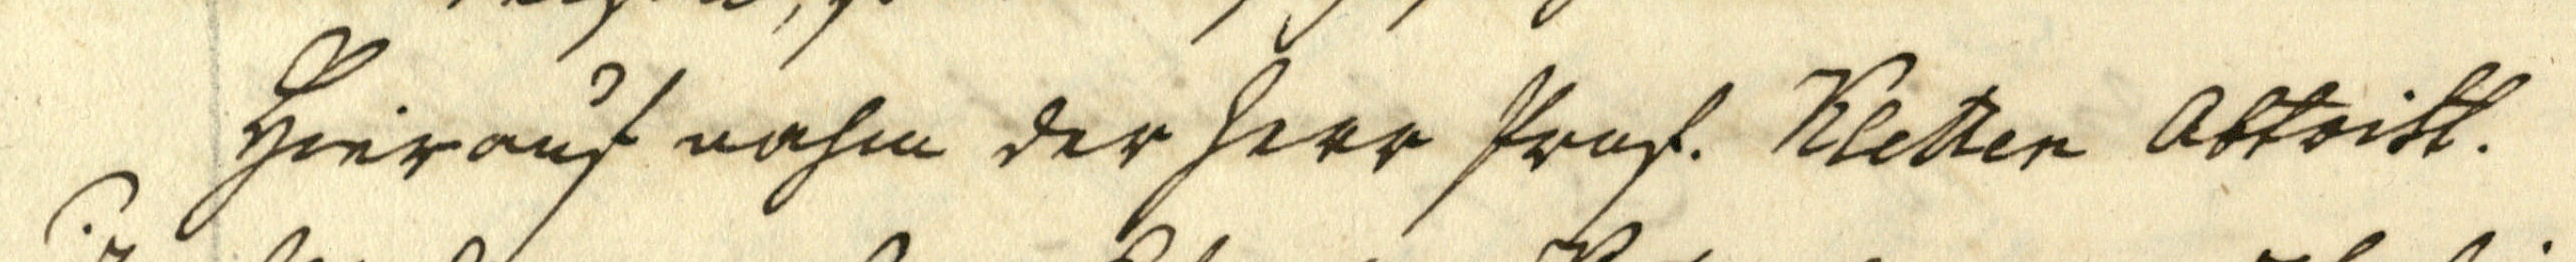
Hierauf nahm der Herr Prof. Kletten Abtritt.
